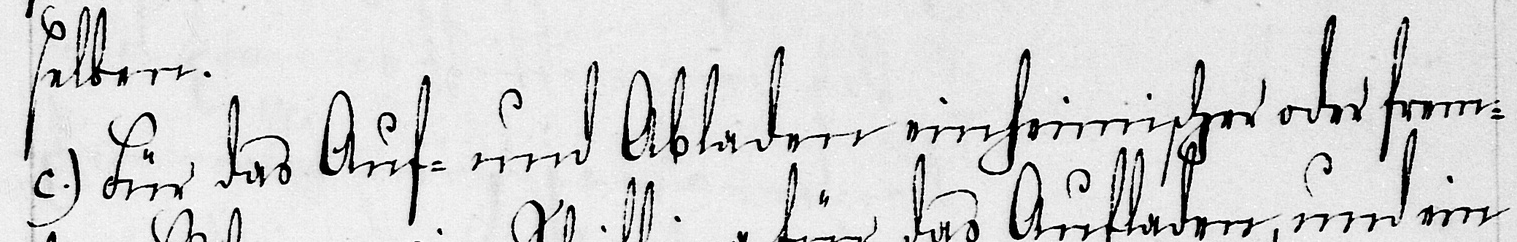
c.) Für das Auf- und Abladen einheimischer oder frem¬
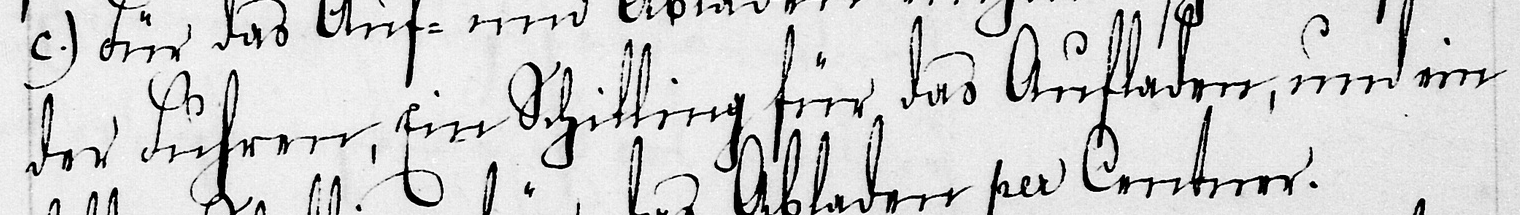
der Fuhren, Ein Schilling für das Aufladen, und ein
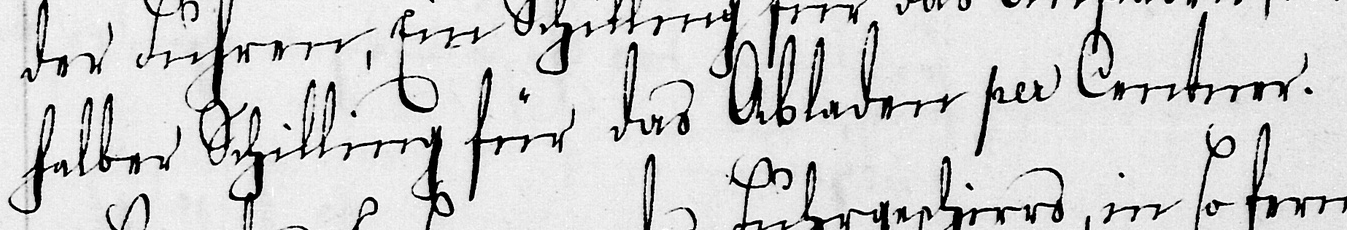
halber Schilling für das Abladen per Centner.
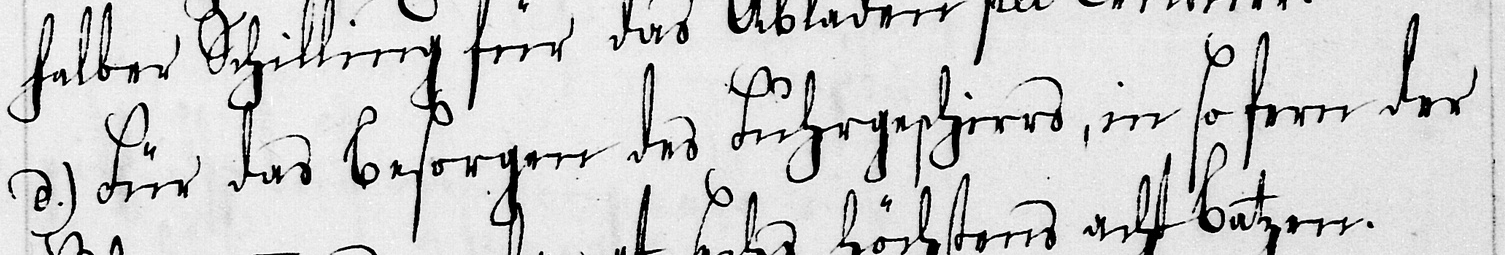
d.) Für das Besorgen des Fuhrgeschirrs, in so fern der
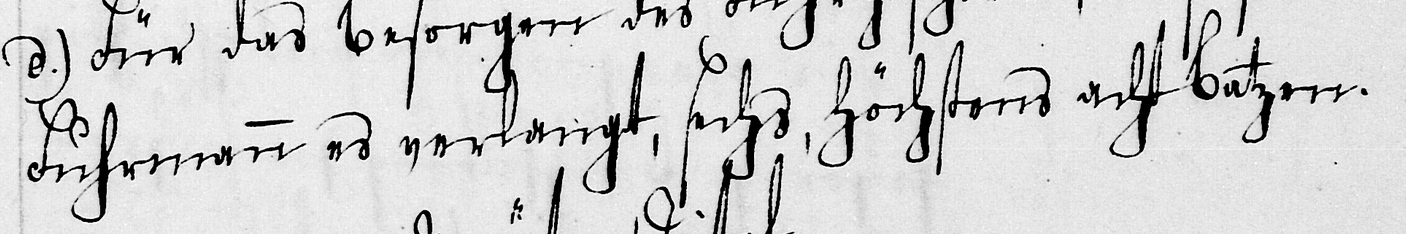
Fuhrmann es verlangt, sechs, Höchstens acht Batzen.
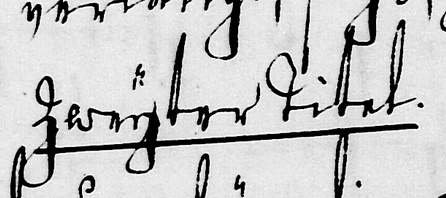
Zweyter Titel.
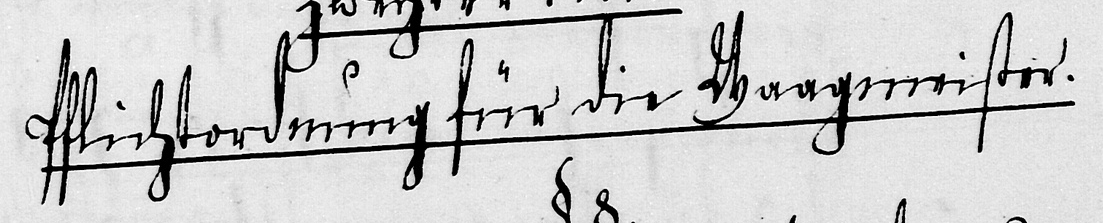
Pflichtordnung für die Waagmeister.
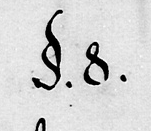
§. 8.
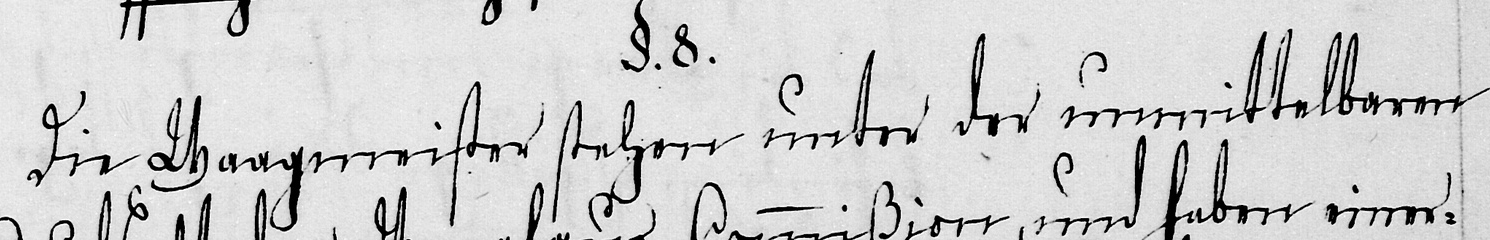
Die Waagmeister stehen unter der unmittelbaren
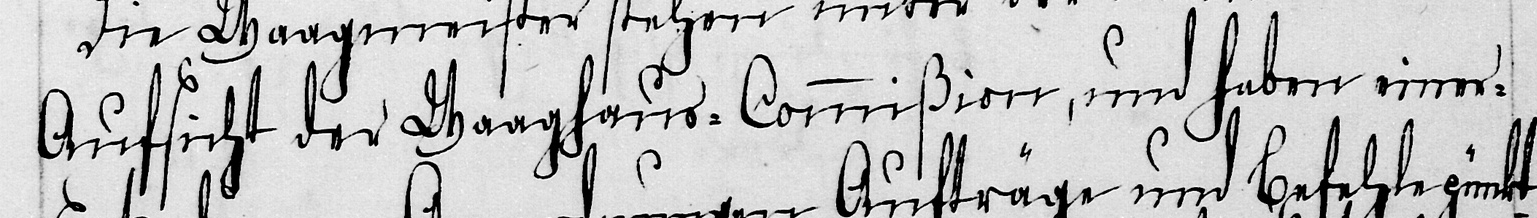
Aufsicht der Waaghaus-Commißon, und haben einer¬
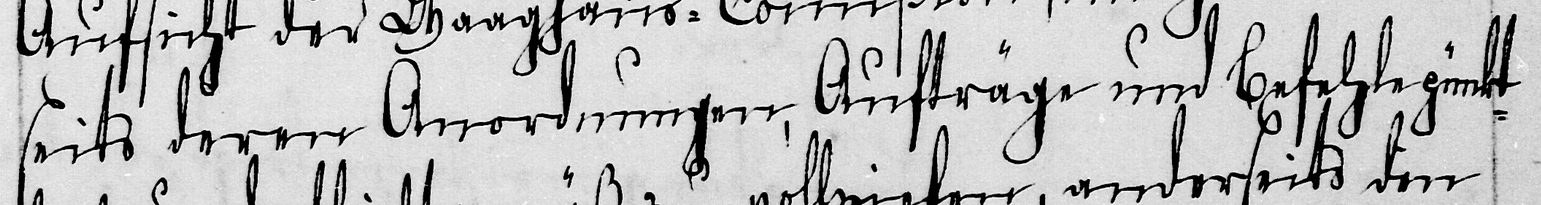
seits deren Anordnungen, Aufträge und Befehle pünk¬
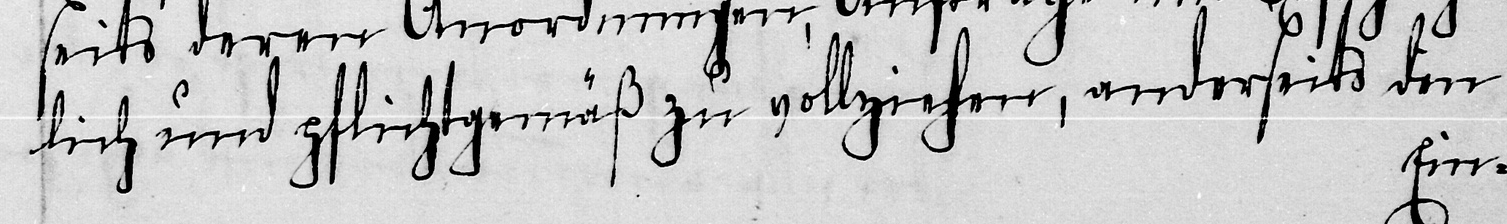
tlich und pflichtgemäß zu vollziehen, anderseits den
